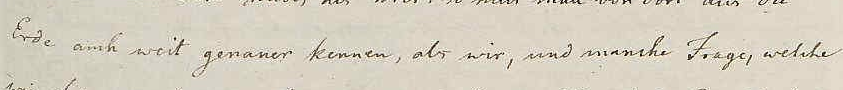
Erde auch weit genauer kennen, als wir, und manche Frage, welche
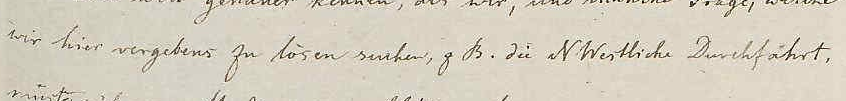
wir hier vergebens zu lösen suchen, zB. die NWestliche Durchfahrt,
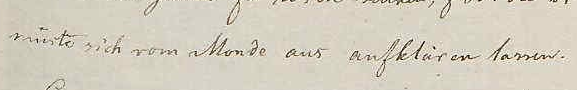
müste sich vom Monde aus aufklären lassen.
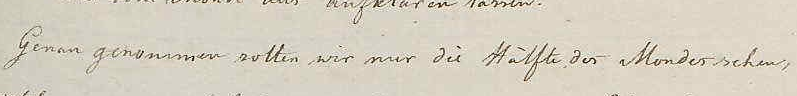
Genau genommen solten wir nur die Hälfte des Mondes sehen,
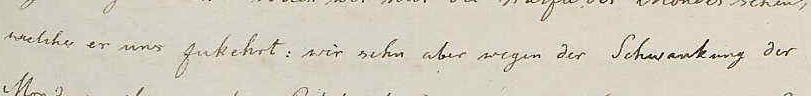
welche er uns zukehrt: wir sehn aber wegen der Schwankung der
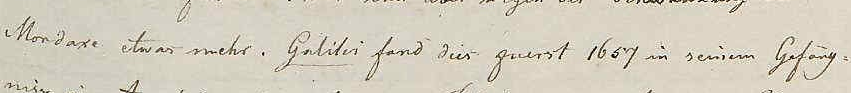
Mondaxe etwas mehr. Galilei fand dies zuerst 1657 in seinem Gefäng-
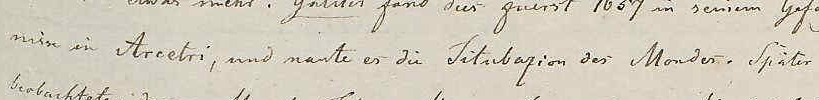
nisse in Arcetri, und nante es die Titubazion des Mondes. Später
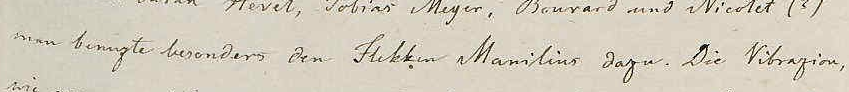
man benuzte besonders den Flekken Manilius dazu. Die Vibrazion,
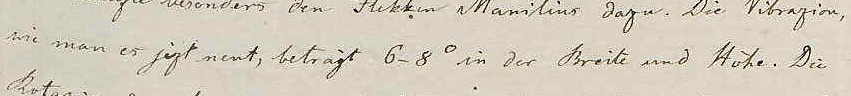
wie man es jezt nent, beträgt 6–8° in der Breite und Höhe. Die
